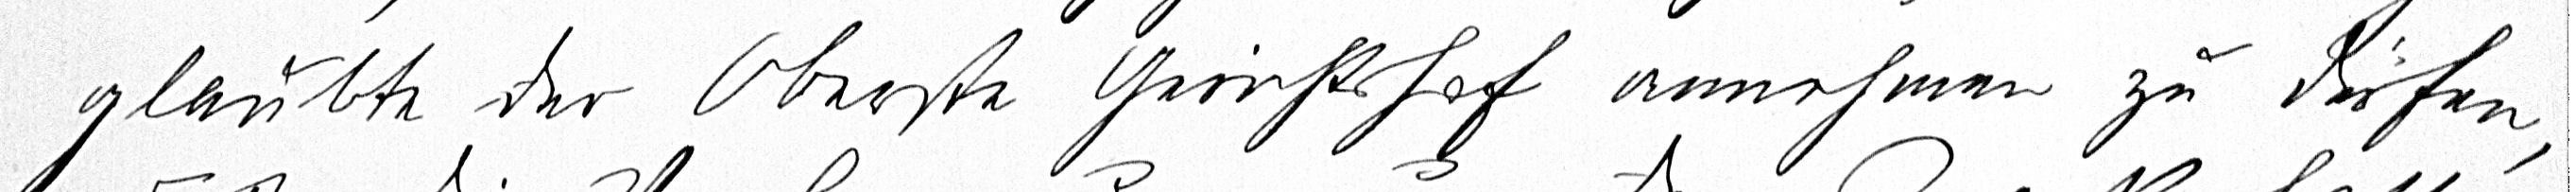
glaubte der Oberste Gerichtshof annehmen zu dürfen,
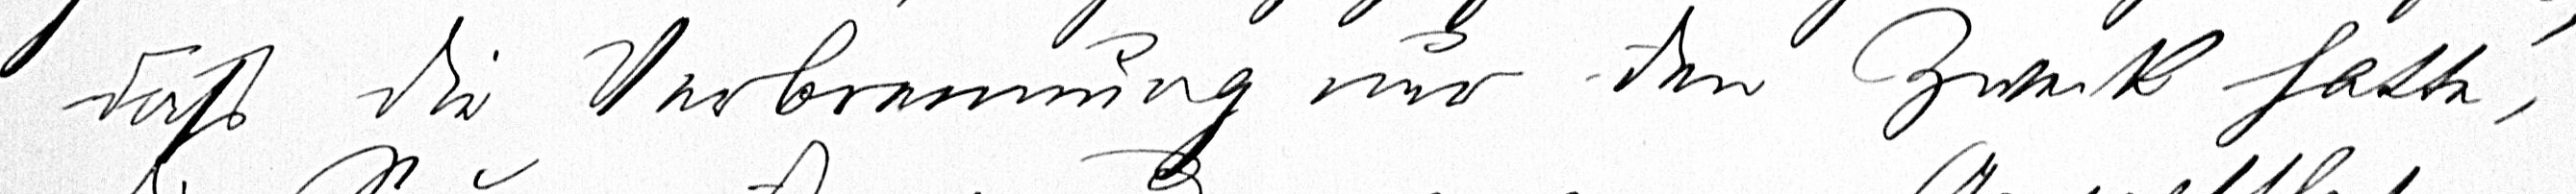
dass die Verbrennung nur den Zweck hatte,
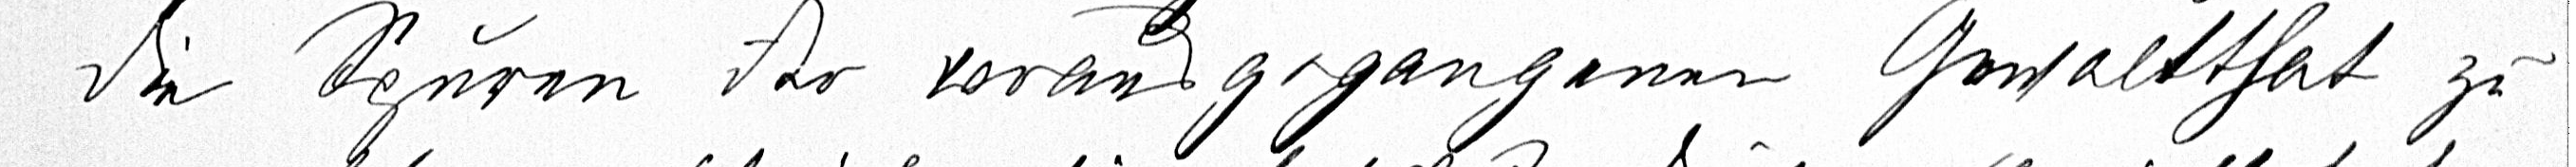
die Spuren der vorausgegangenen Gewaltthat zu
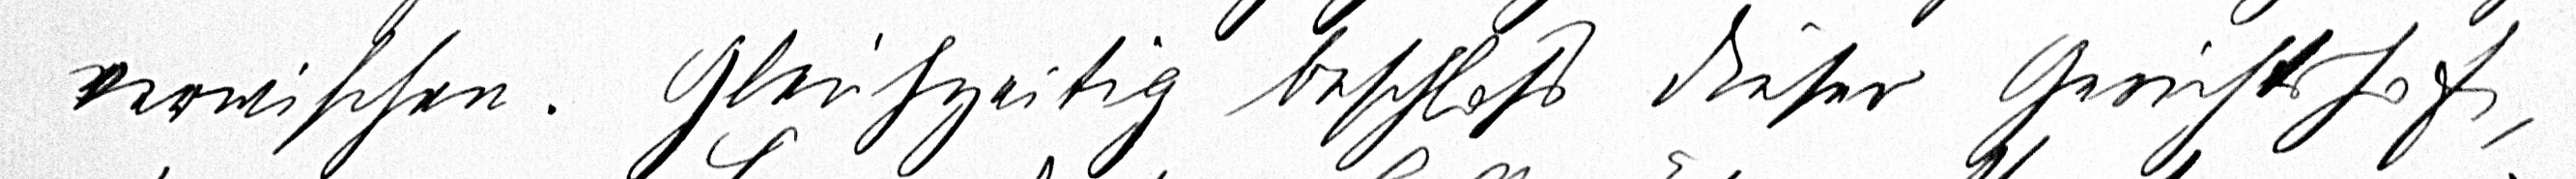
verwischen. Gleichzeitig beschloss dieser Gerichtshof,
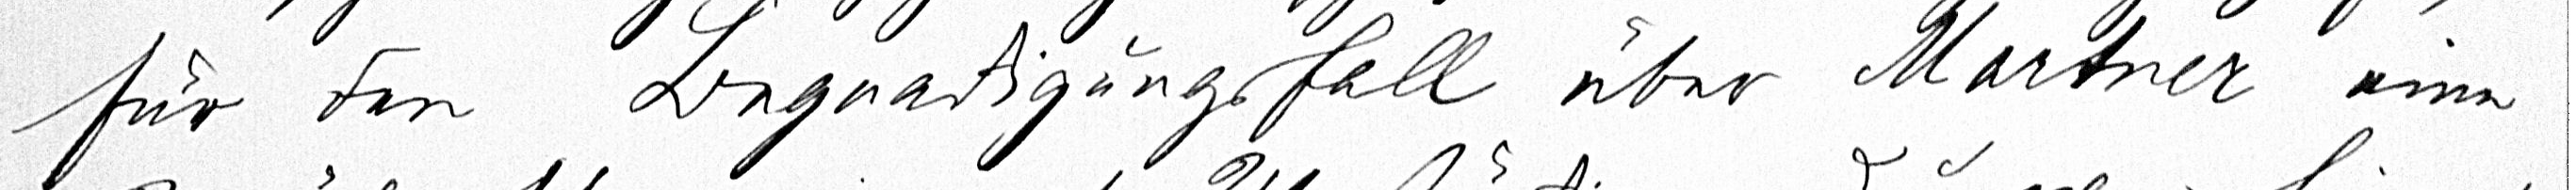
für den Begnadigungsfall über Martner eine
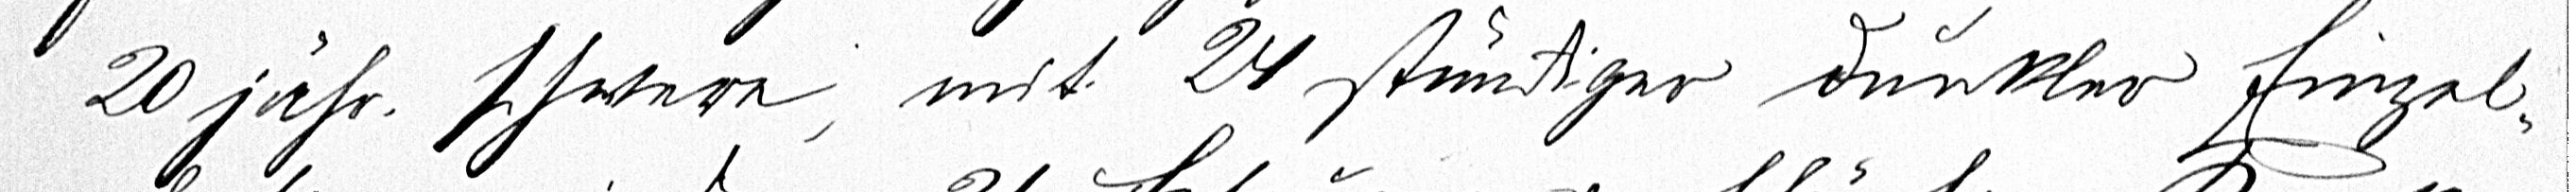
20jähr. schwere, mit 24 ständiger Dunkler Einzel¬
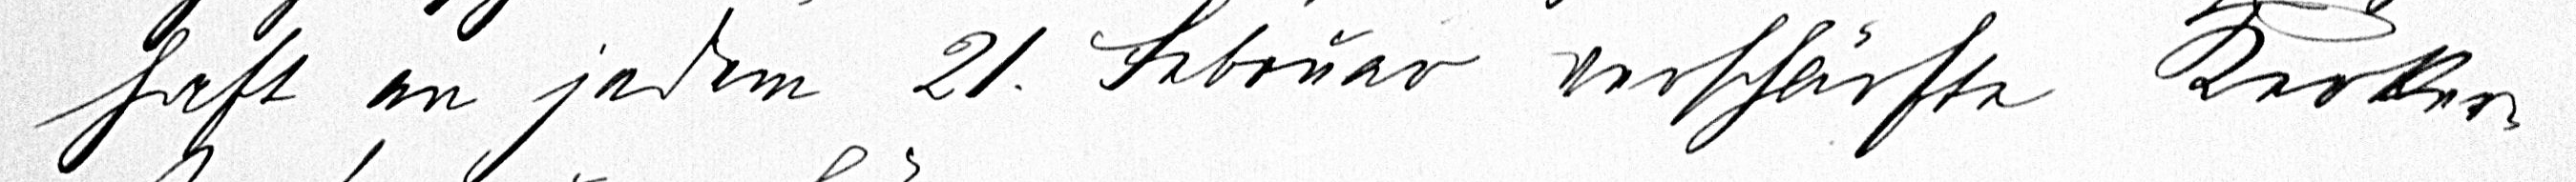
haft an jedem 21. Februar verschärfte Kerker¬
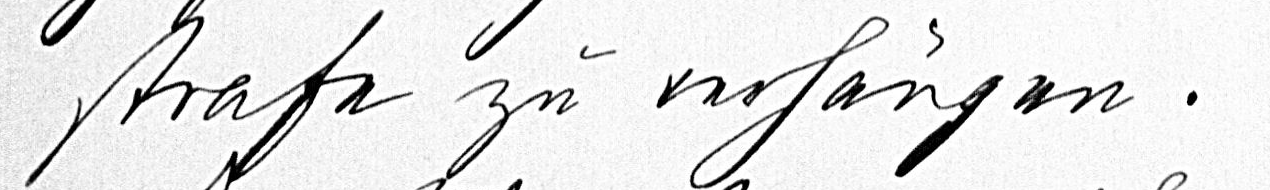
strafe zu verhängen.
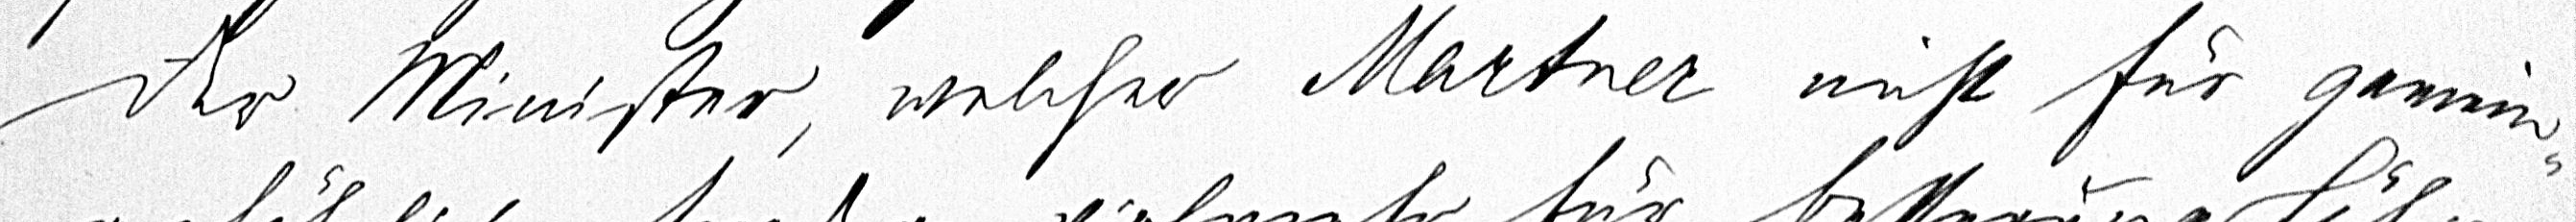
Der Minister, welcher Martner nicht für gemein¬
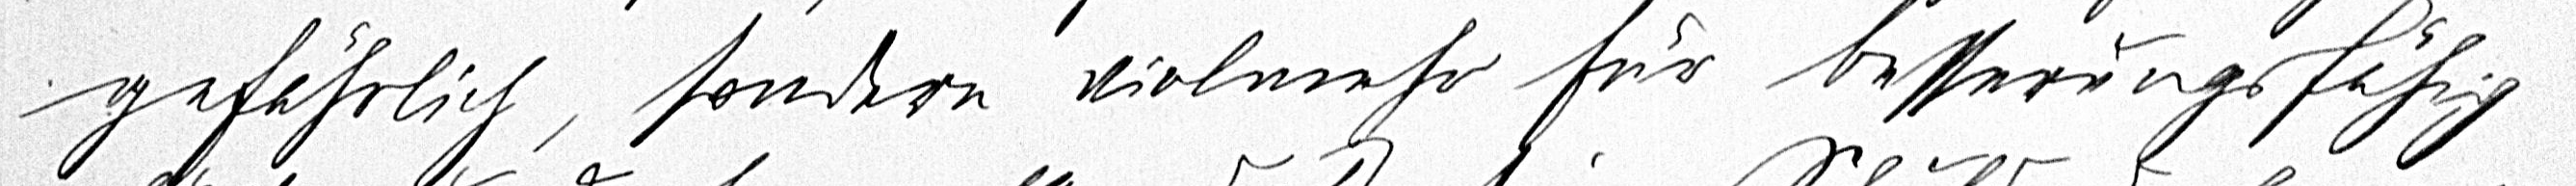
gefährlich, sondern vielmehr für besserungsfähig
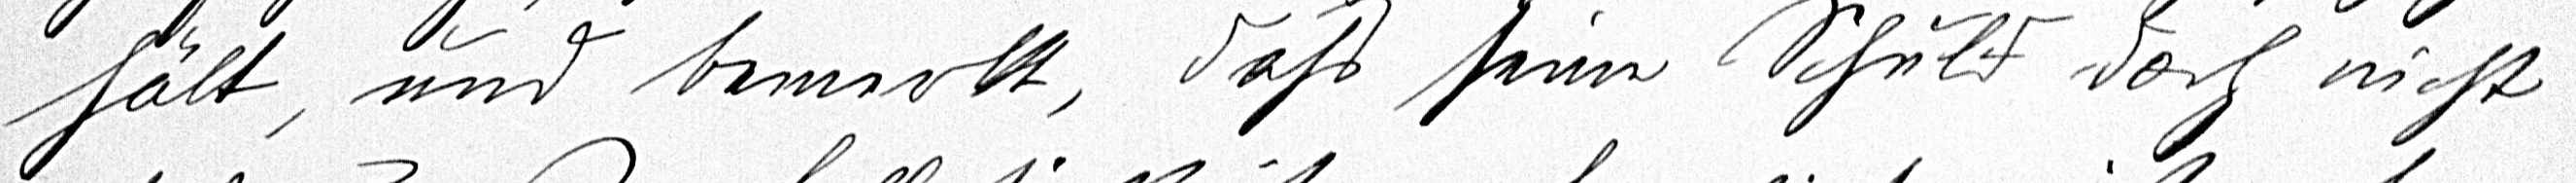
hält, und bemerkt, dass seine Schuld doch nicht
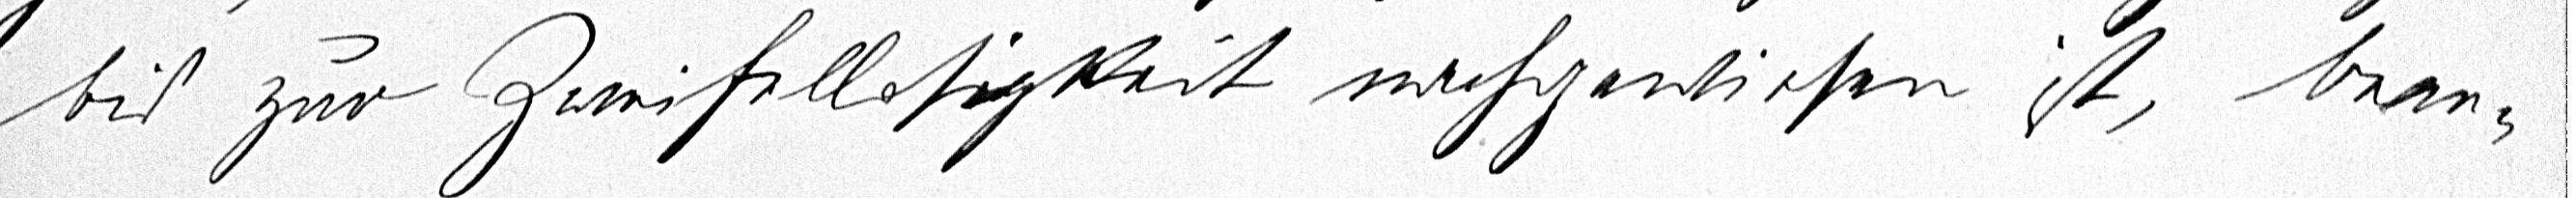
bis zur Zweifellosigkeit nachgewiesen ist, bean¬
